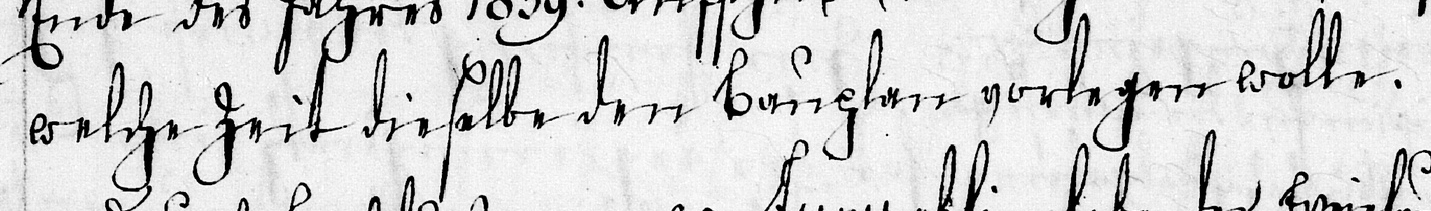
welche Zeit dieselbe den Bauplan vorlegen wolle.
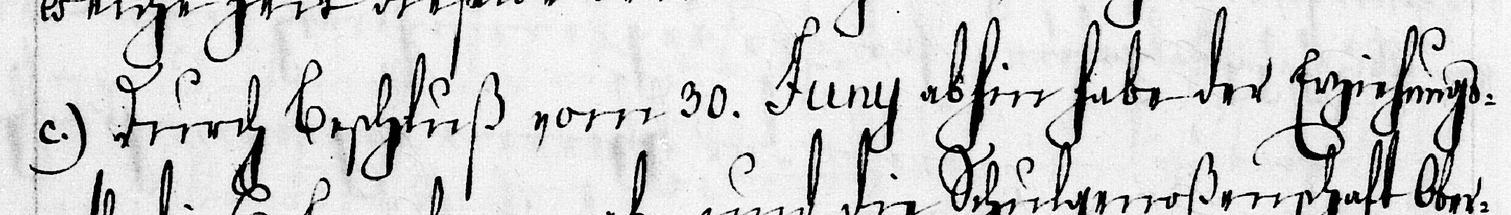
c.) Durch Beschluß vom 30. Juny abhin habe der Erziehung¬
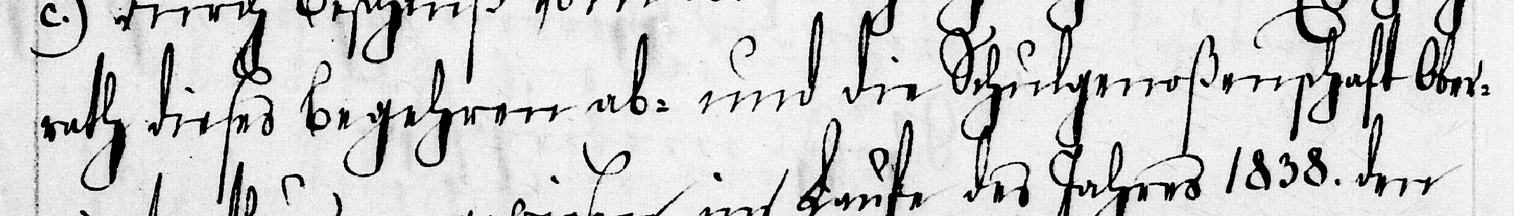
srath dieses Begehren ab- und die Schulgenoßenschaft Ober¬
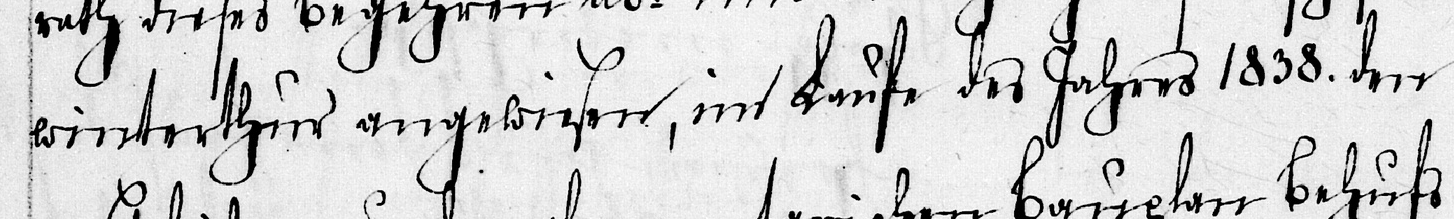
winterthur angewiesen, im Laufe des Jahres 1838. den
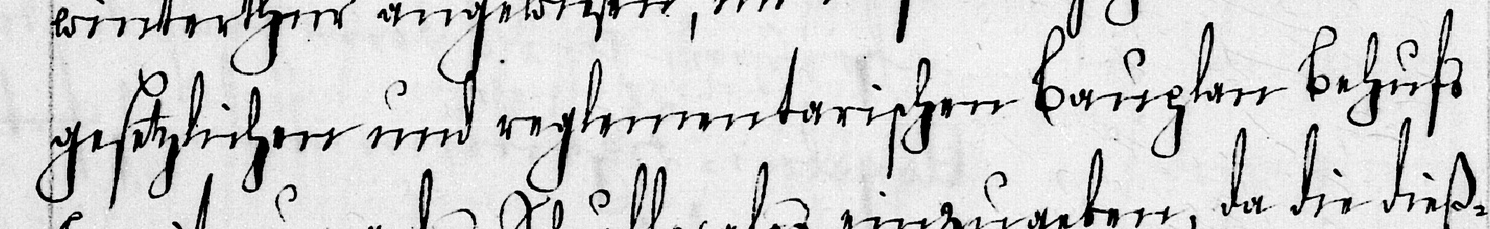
gesetzlichen und reglementarischen Bauplan Behufs
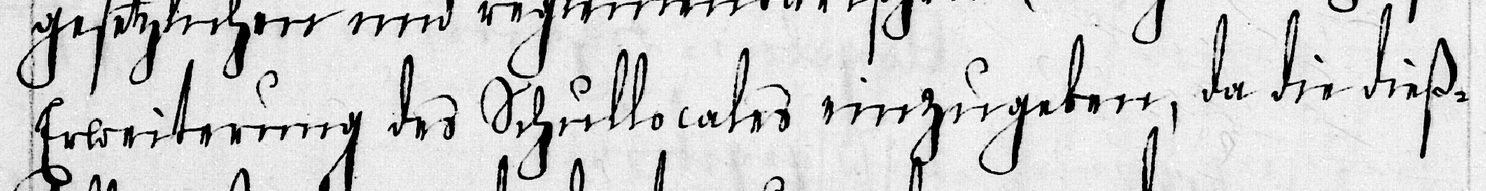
Erweiterung des Schullocales einzugeben, da die dieß¬
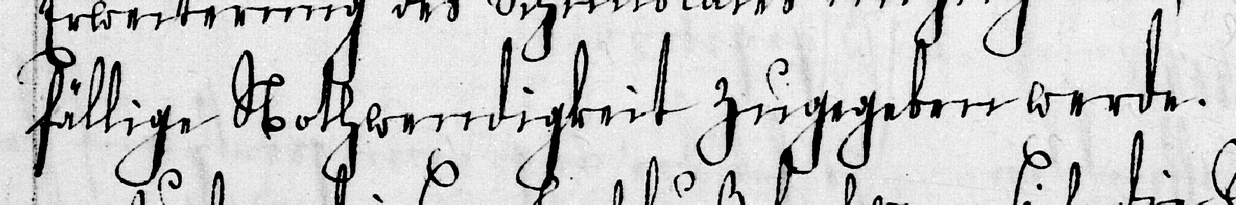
fällige Nothwendigkeit zugegeben werde.
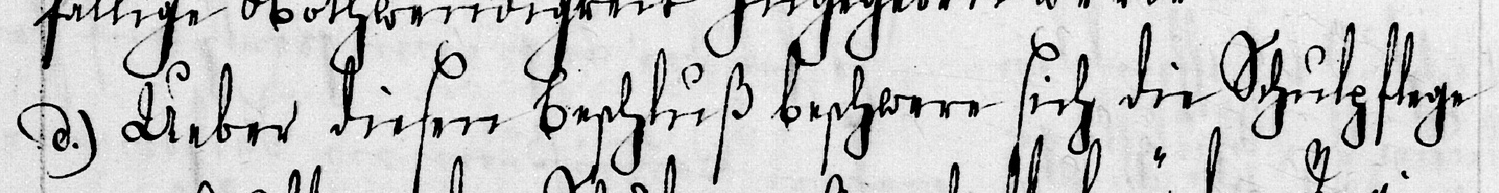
d.) Ueber diesen Beschluß beschwere sich die Schulpflege
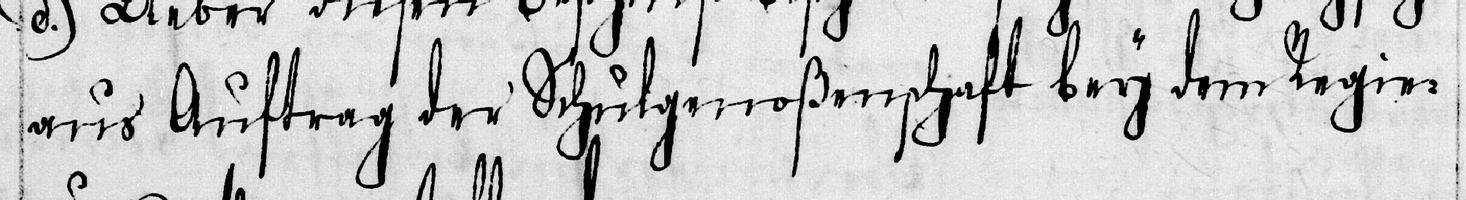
aus Auftrag der Schulgenoßenschaft bey dem Regie¬
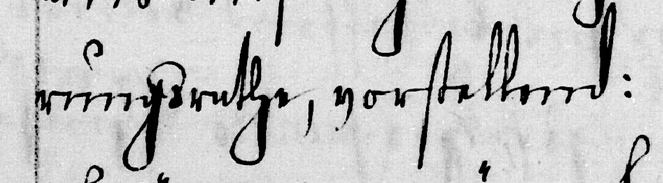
rungsrathe, vorstellend:
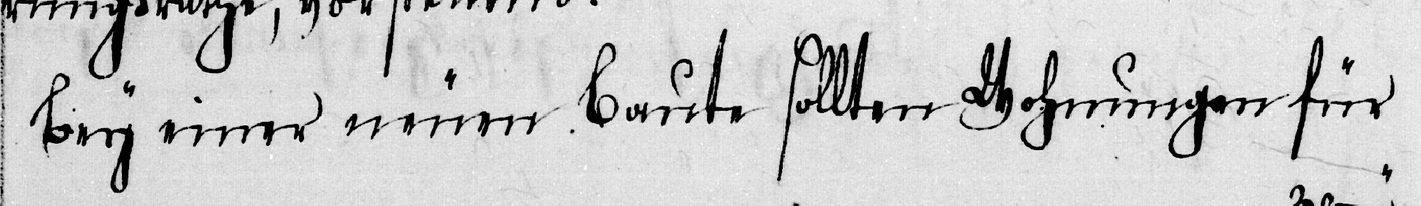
Bey einer neuen Baute sollten Wohnungen für
